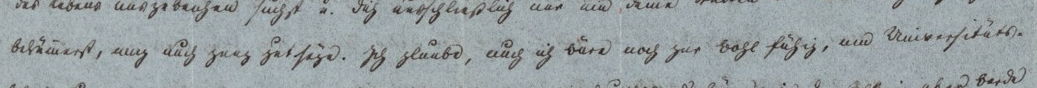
bekümmerst, mag auch ganz gut seyn. Ich glaube, auch ich wäre noch gar wohl fähig, am Universitäts-
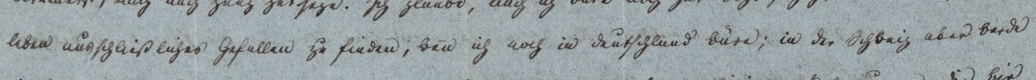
leben ausschließliches Gefallen zu finden, wenn ich noch in Deutschland wäre; in der Schweiz aber werde
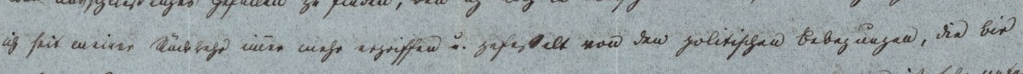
ich seit meiner Rückkehr immer mehr ergriffen u. gefesselt von den politischen Bewegungen, die wir
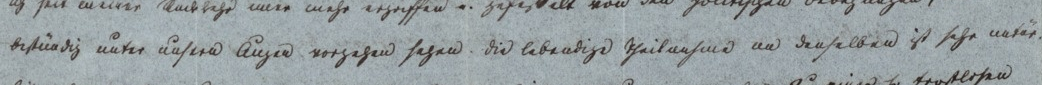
beständig unter unsern Augen vorgehen sehen. Die lebendige Theilnahme an denselben ist sehr natür-
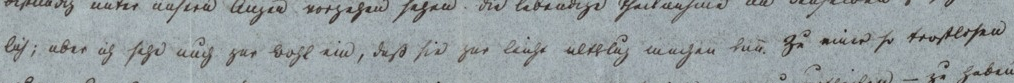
lich; aber ich sehe auch gar wohl ein, daß sie gar leicht altklug machen kann. Zu einer so trostlosen
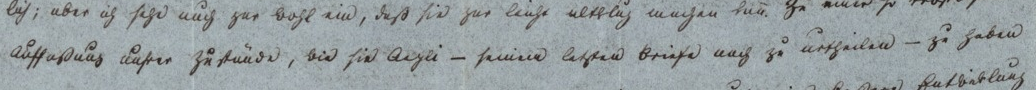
Auffassung unsrer Zustände, wie sie Aepli – seinem letzten Briefe nach zu urtheilen – zu haben
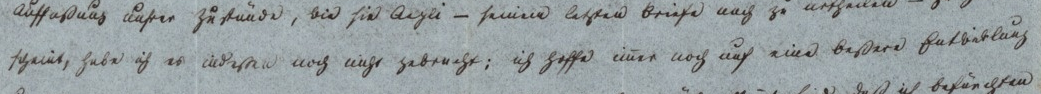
scheint, habe ich es indessen noch nicht gebracht; ich hoffe immer noch auf eine bessere Entwicklung
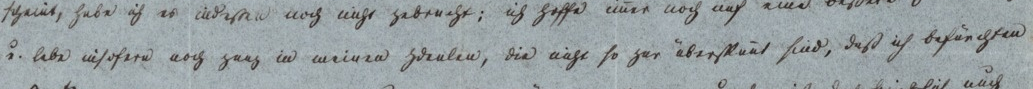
u. lebe insofern noch ganz in meinen Idealen, die nicht so gar überspannt sind, daß ich befürchten
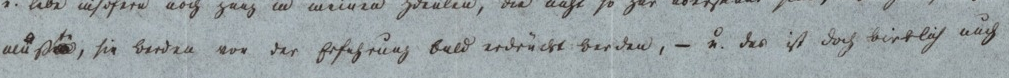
müßte, sie werden von der Erfahrung bald erdrückt werden, – u. das ist doch wirklich auch
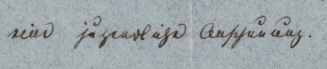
eine jugendliche Anschauung.
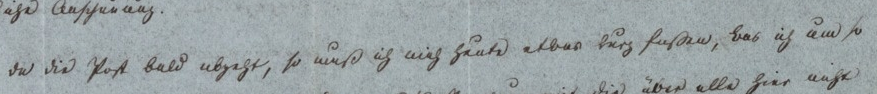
Da die Post bald abgeht, so muß ich mich heute etwas kurz fassen, was ich um so
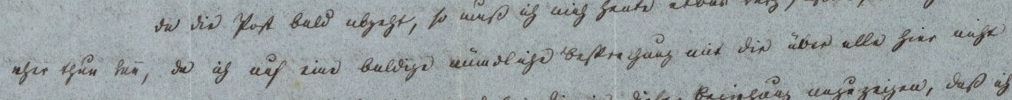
eher thun kann, da ich auf eine baldige mündliche Besprechung mit Dir über alle hier nicht
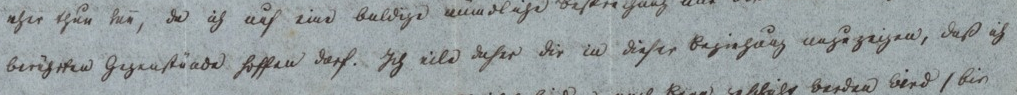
berührten Gegenstände hoffen darf. Ich eile daher Dir in dieser Beziehung anzuzeigen, daß ich
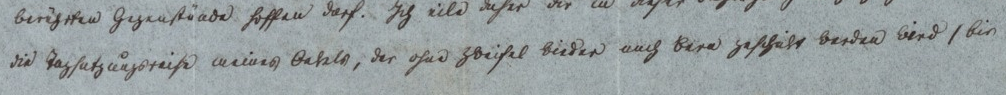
die Tagsatzungsreise meines Onkels, der ohne Zweifel wieder nach Bern geschickt werden wird (bis
